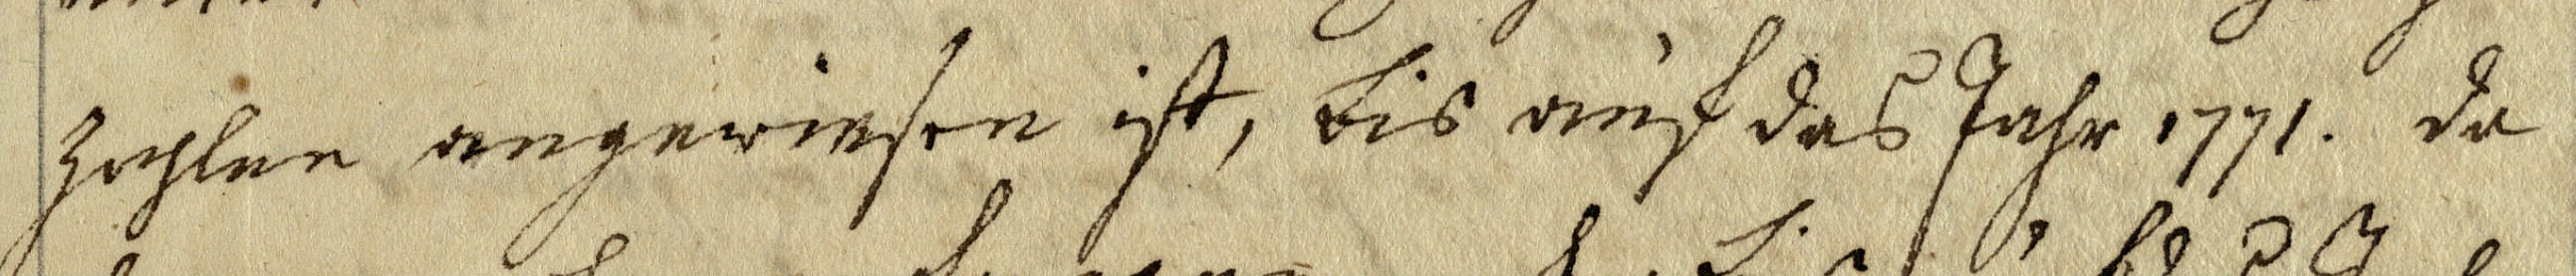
zahlen angewiesen ist, bis auf das Jahr 1771. da
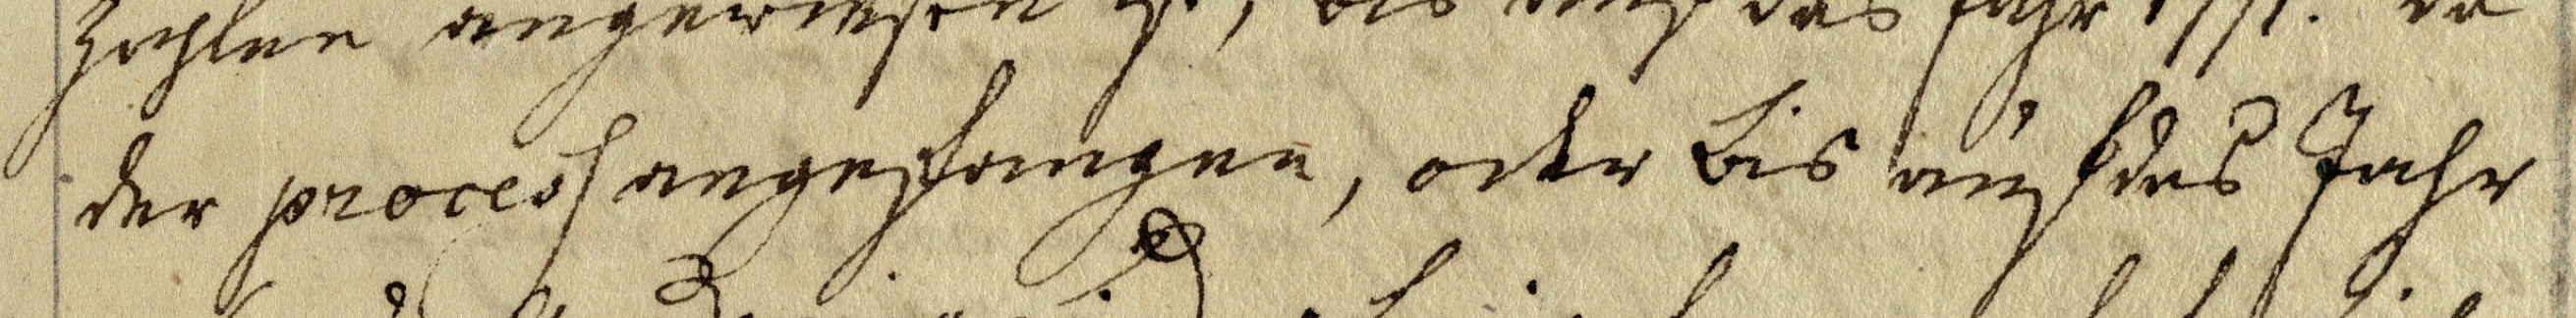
der process angefangen, oder bis auf das Jahr
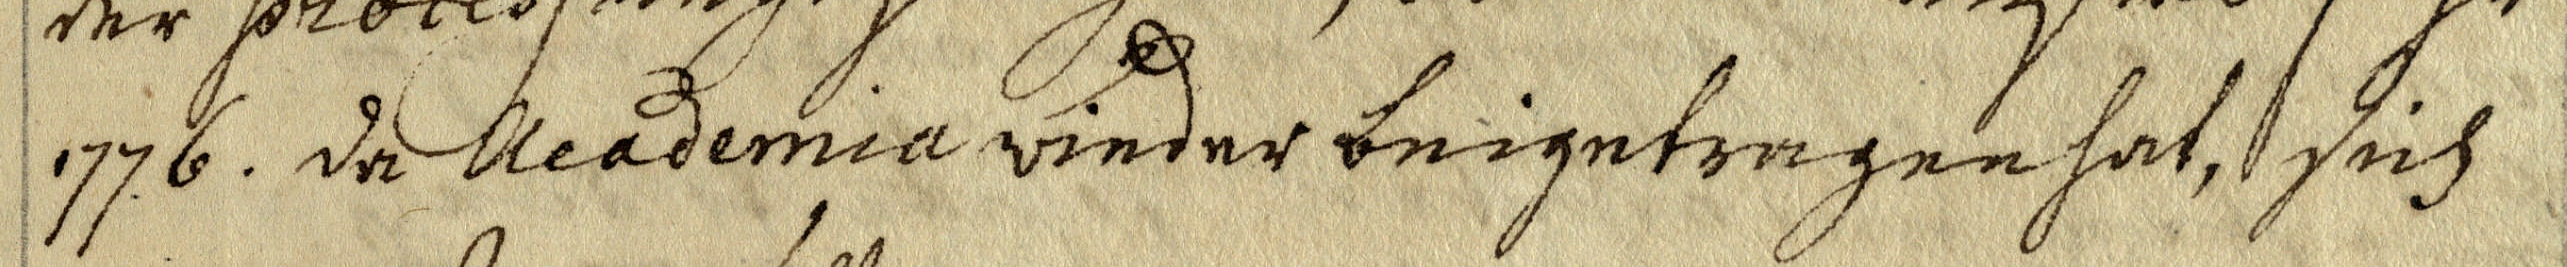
1776. da Academia wieder beigetragen hat, sich
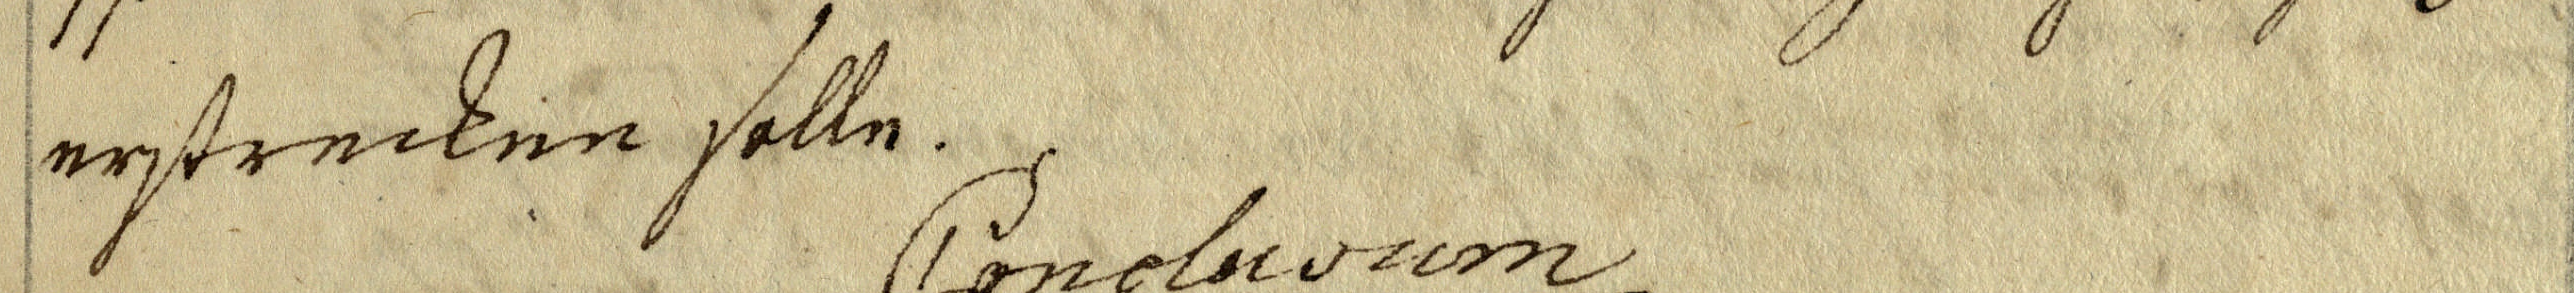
erstrecken solle.
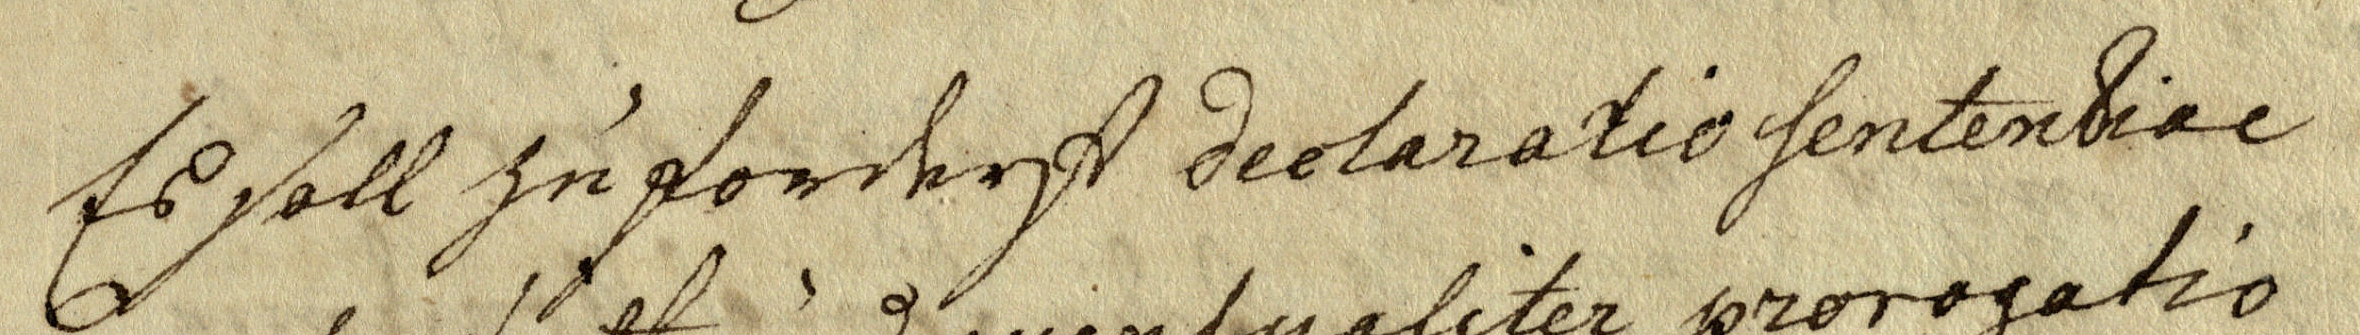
Es soll zu forderst declaratio sententiae
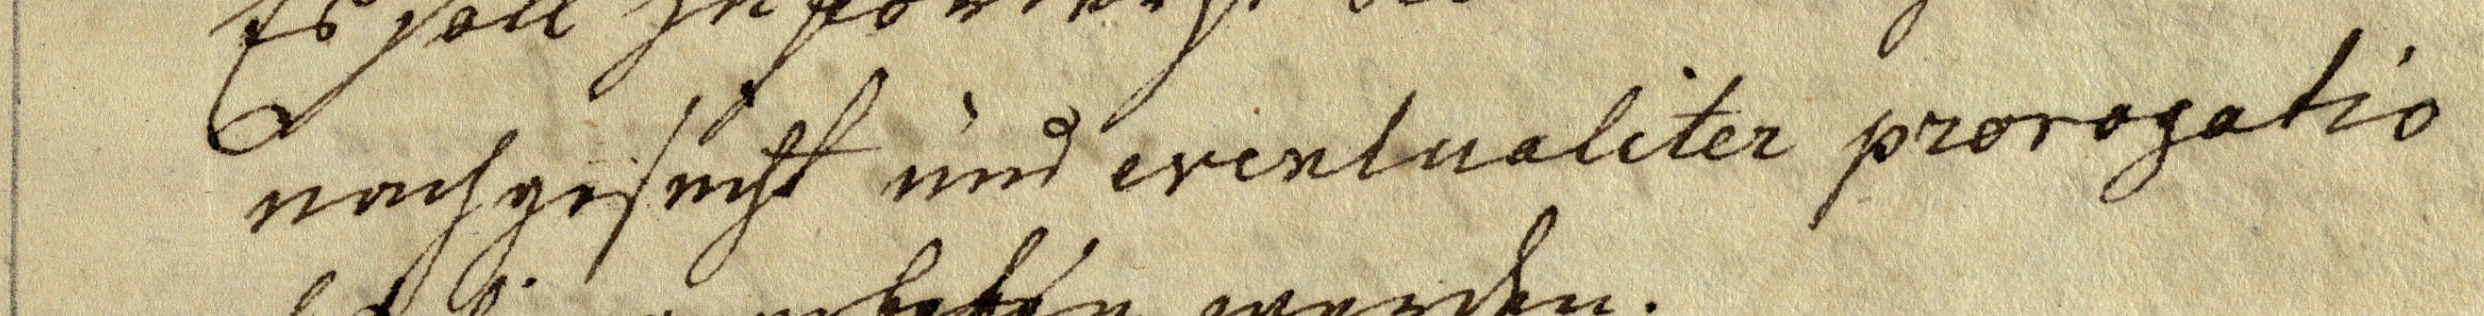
nachgesucht und eventualiter prorogatio
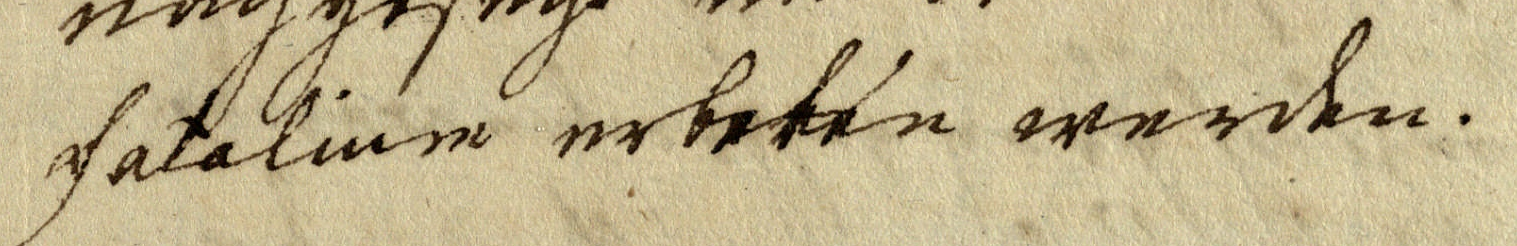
satalium erbeten werden.
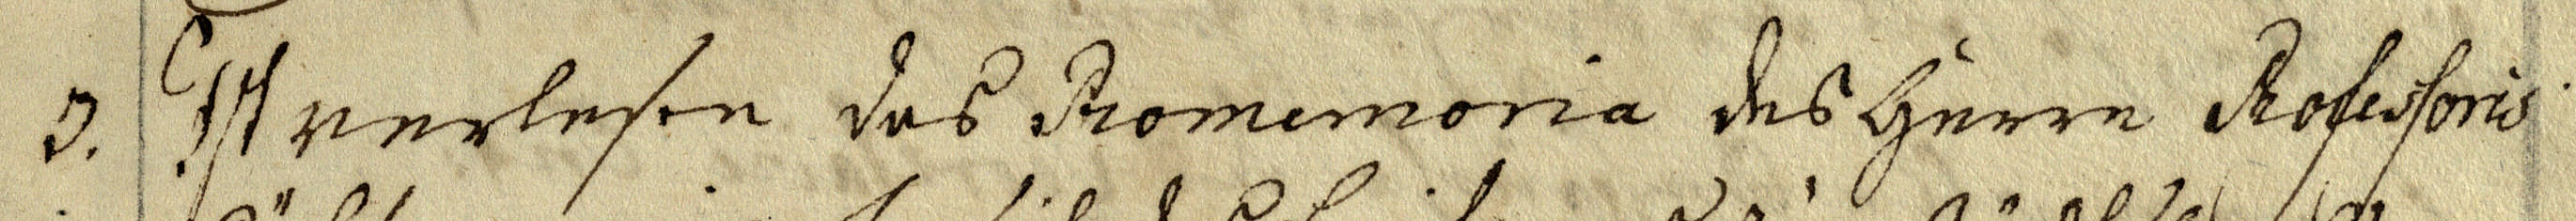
3. Ist verlesen das Promemoria des Herrn Professoris
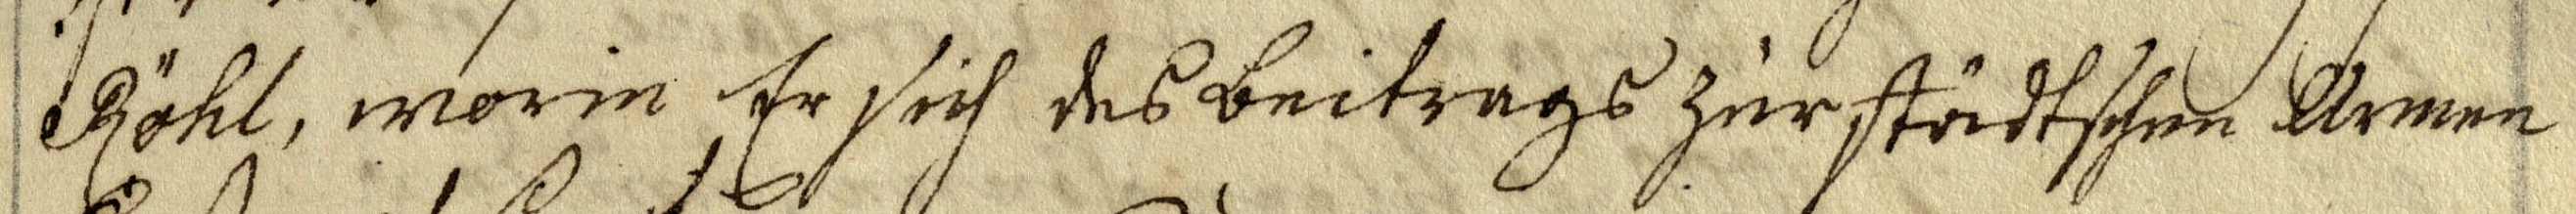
Röhl, worin Er sich des Beitrags zur städtischen Armen
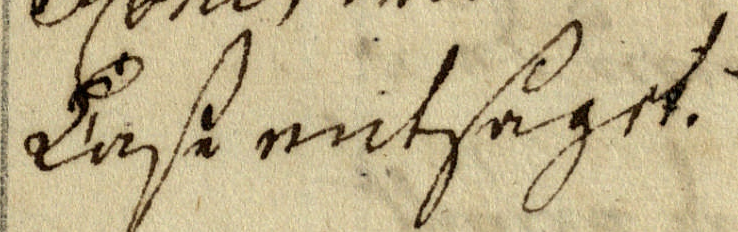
Caße entsaget.
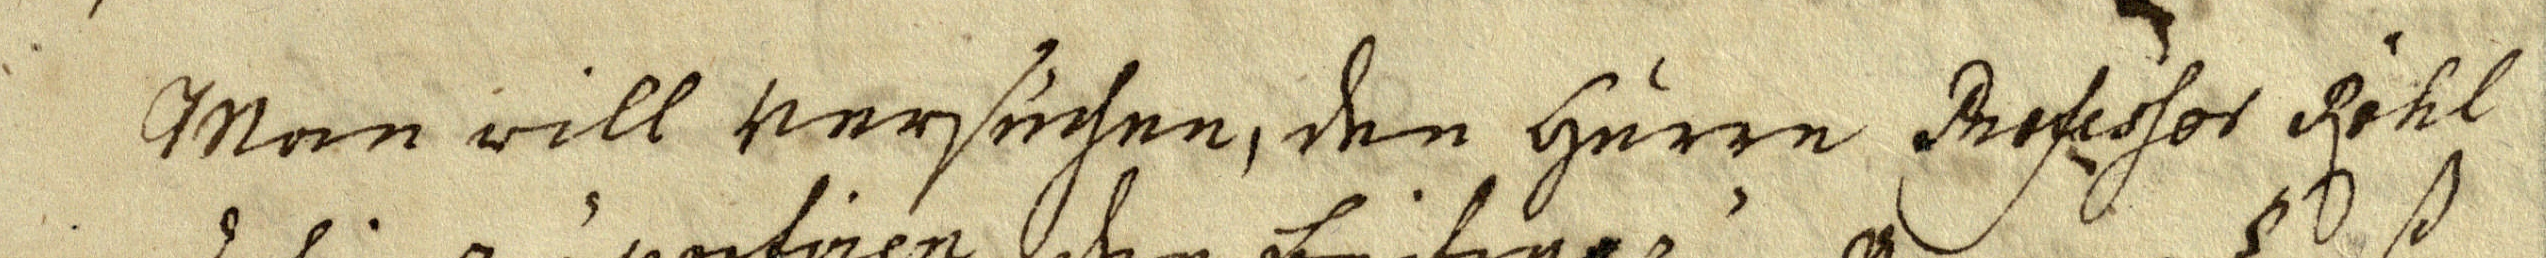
Man will versuchen, den Herrn Professor Röhl
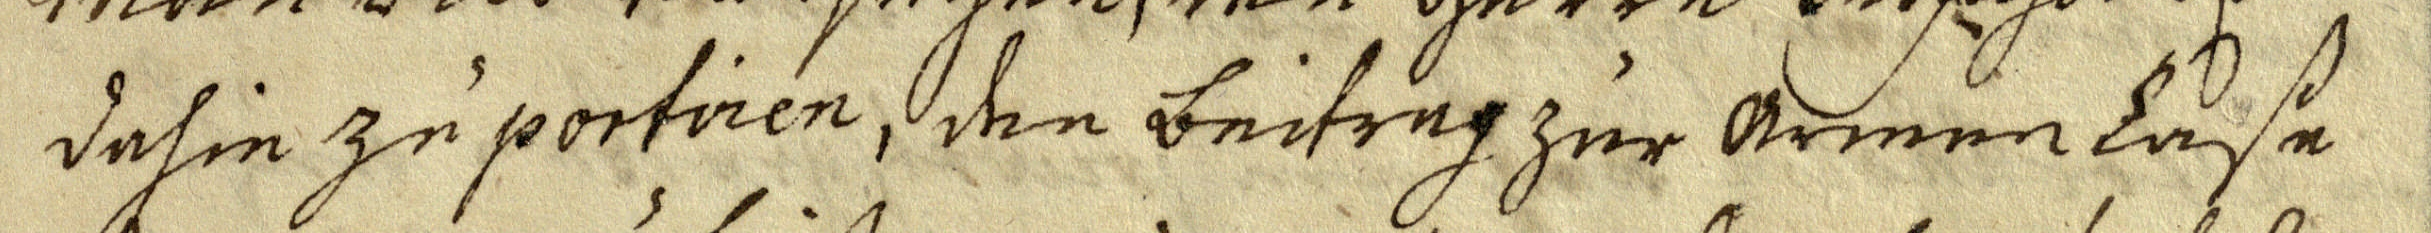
dahin zu portiren, den Beitrag zur Armen Caße
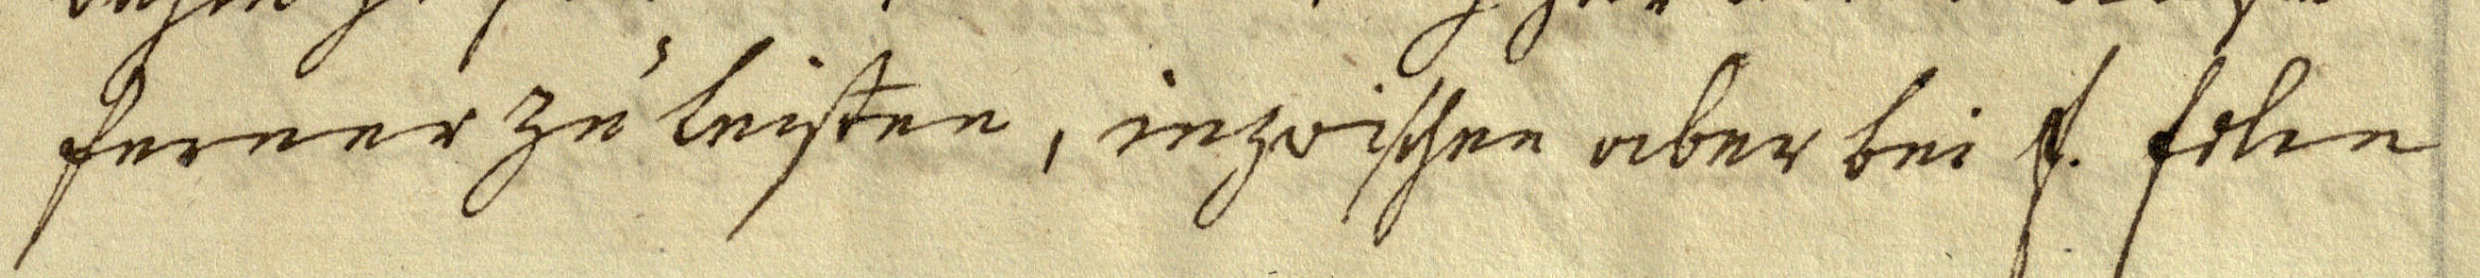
ferner zu leisten, inzwischen aber bei f.felen
